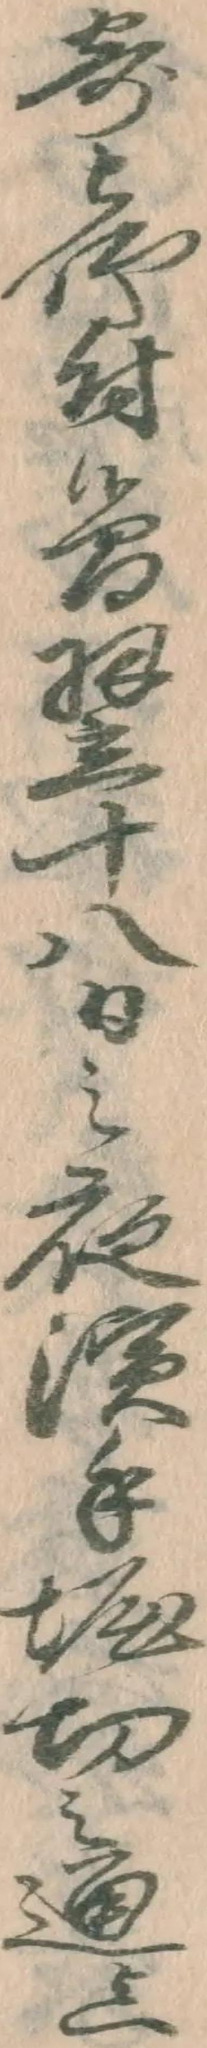寄と仰付候間翌十八日之夜浜手堀切之通迄
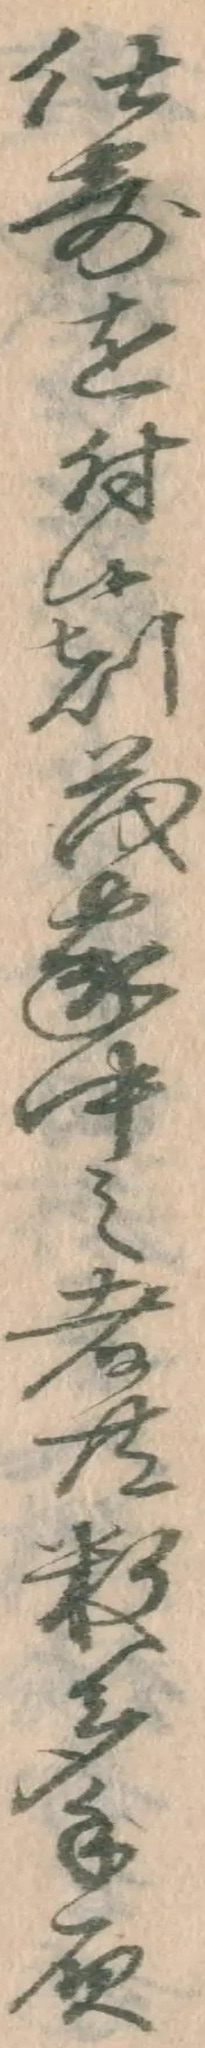仕寄を付候刻茂家中之者共数多手負
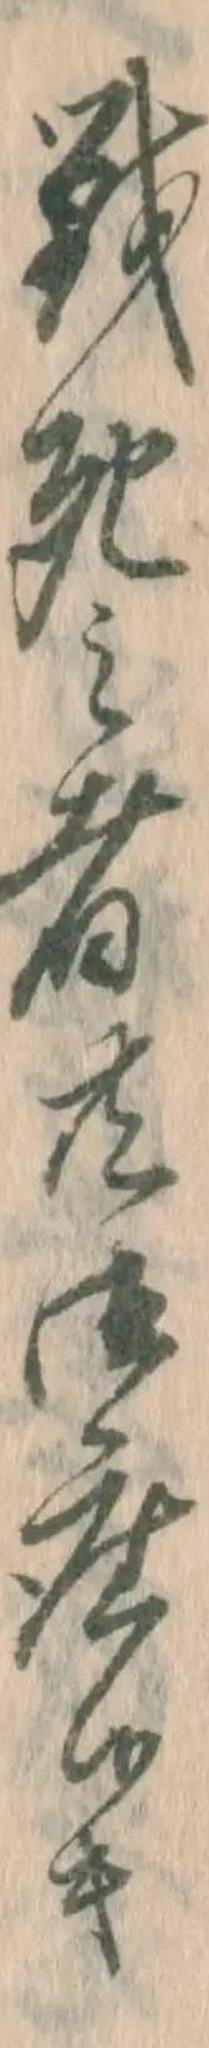戦死之者共御座候き
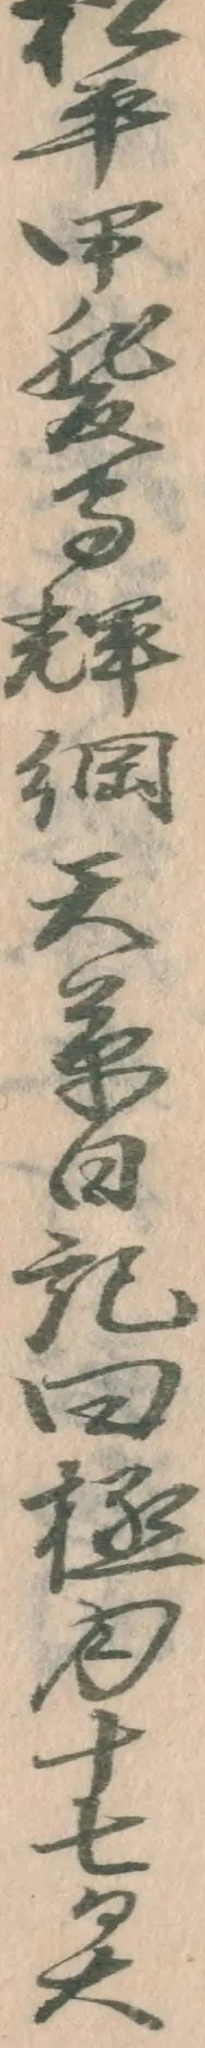松平甲斐守輝綱天草日記曰極月十七日大
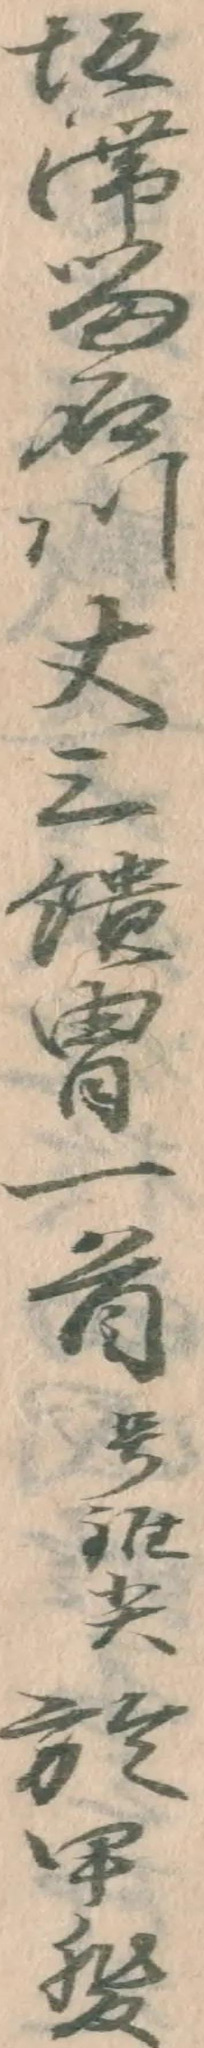坂滞留石川丈三鑓冑一首号錐尖於甲斐
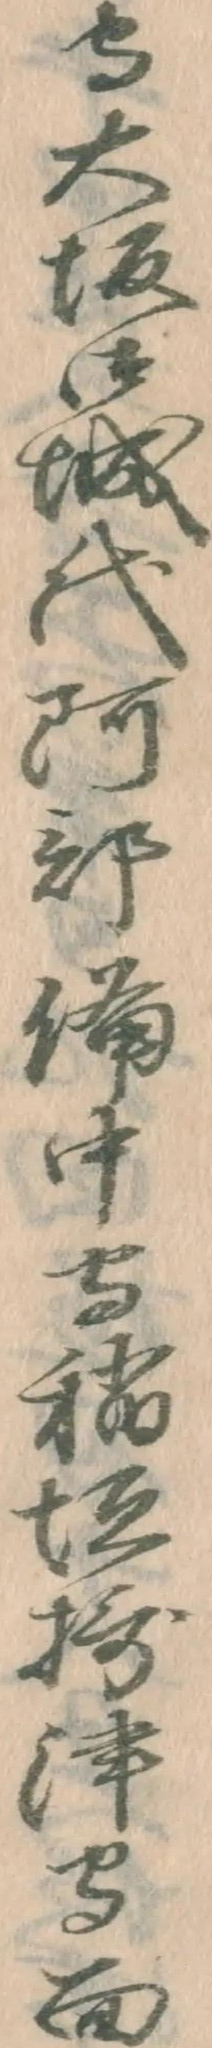守大坂御城代阿部備中守稲垣摂津守面

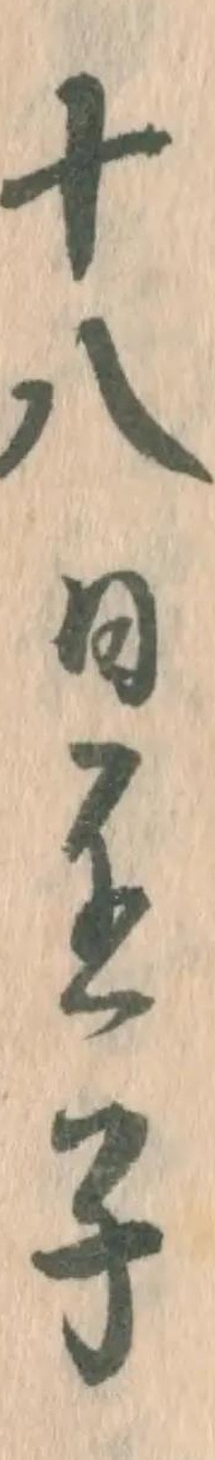十八日壬子
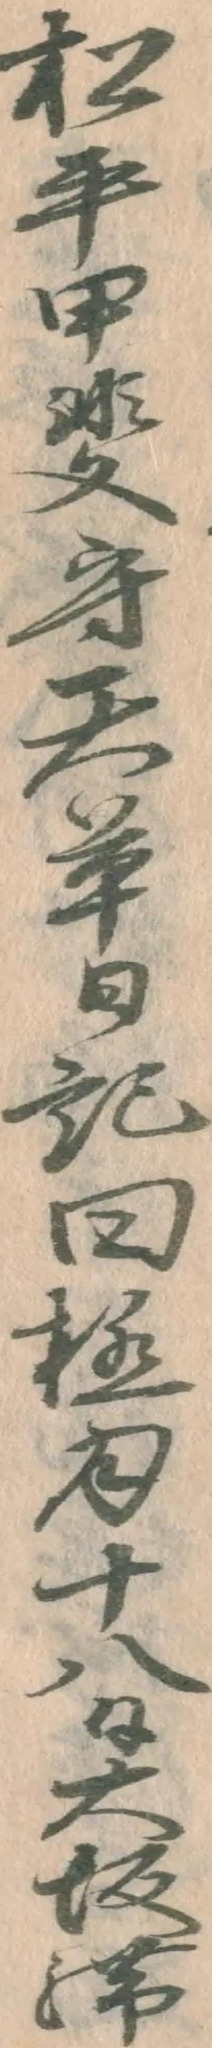松平甲斐守天草日記曰極月十八日大坂滞
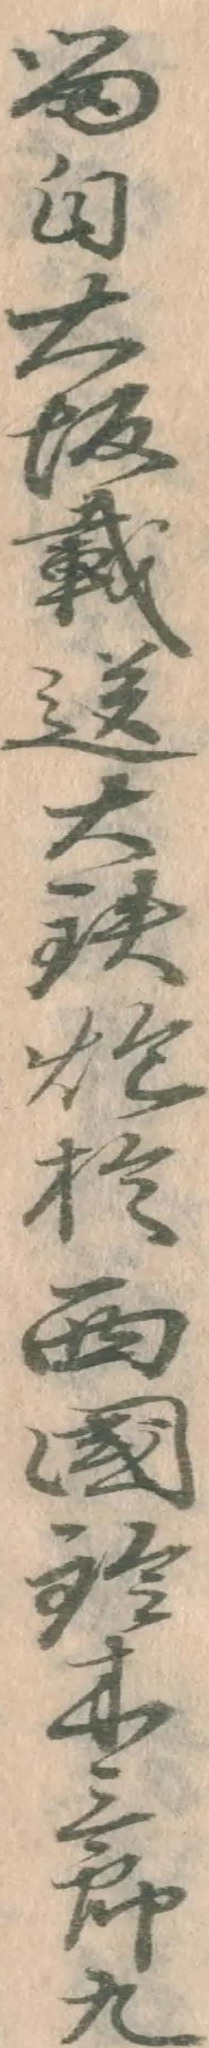留自大坂載送大鉄炮於西国鈴木三郎九
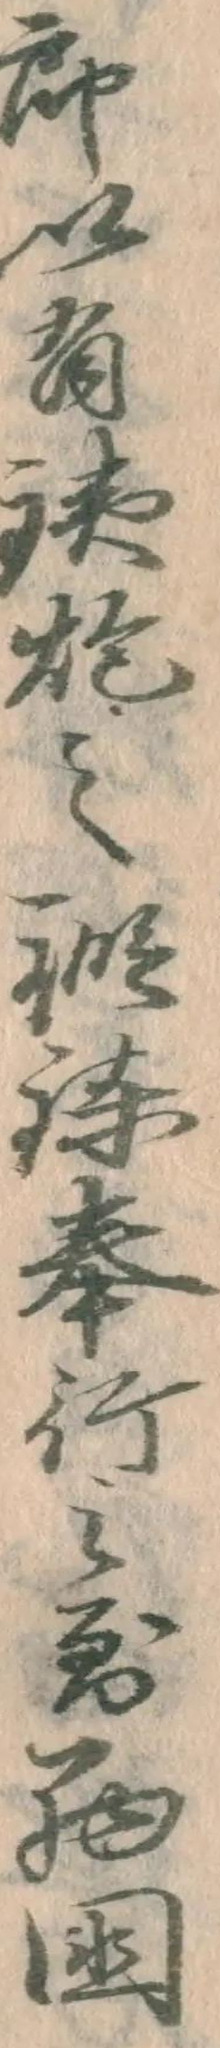郎以有鉄炮之鍛錬奉行之至西国
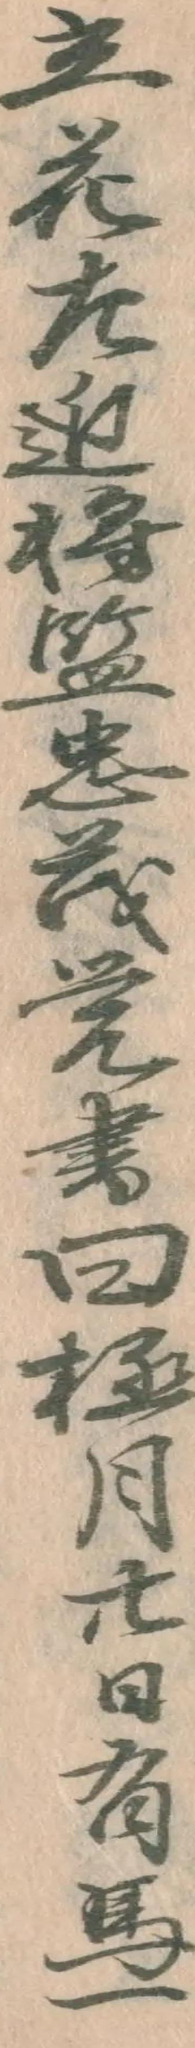立花左近将監忠茂覚書曰極月廿日有馬一
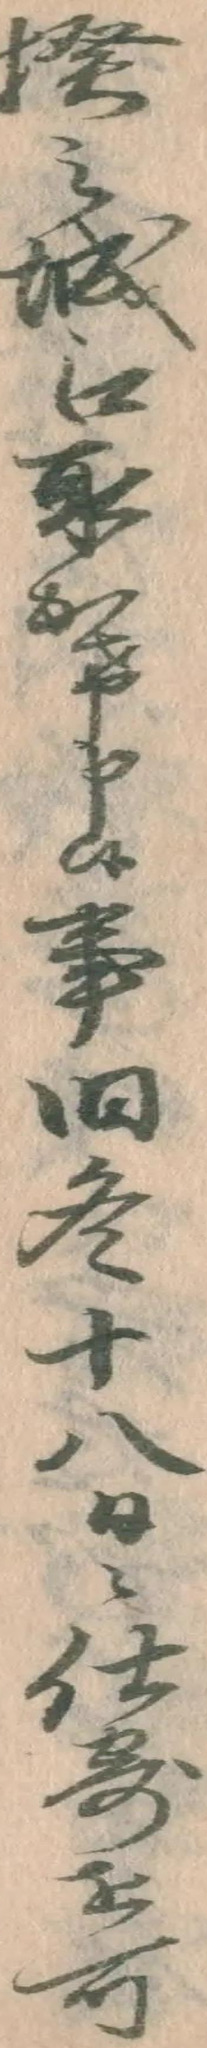揆之城江取加希申候事旧冬十八日仕寄を可
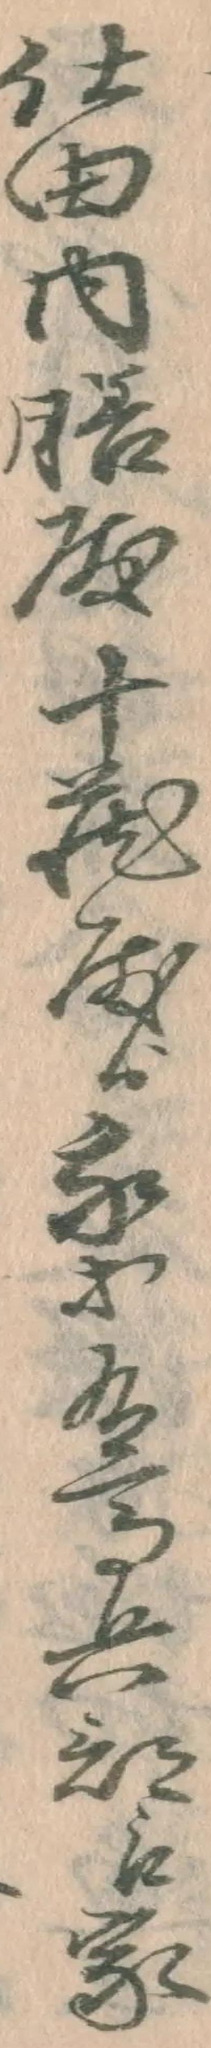仕由内膳殿十蔵殿ゟ我等有馬兵部江家
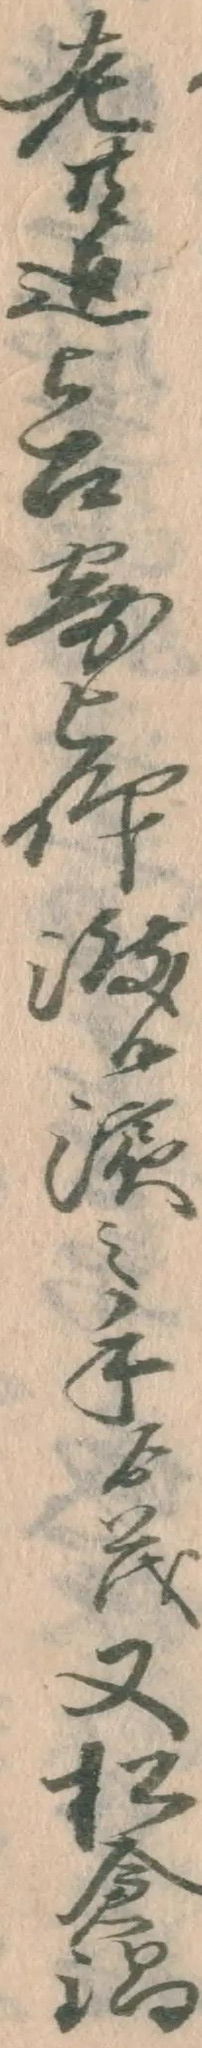老共迄被召寄被仰渡る浜之手ゟ茂又松倉鍋
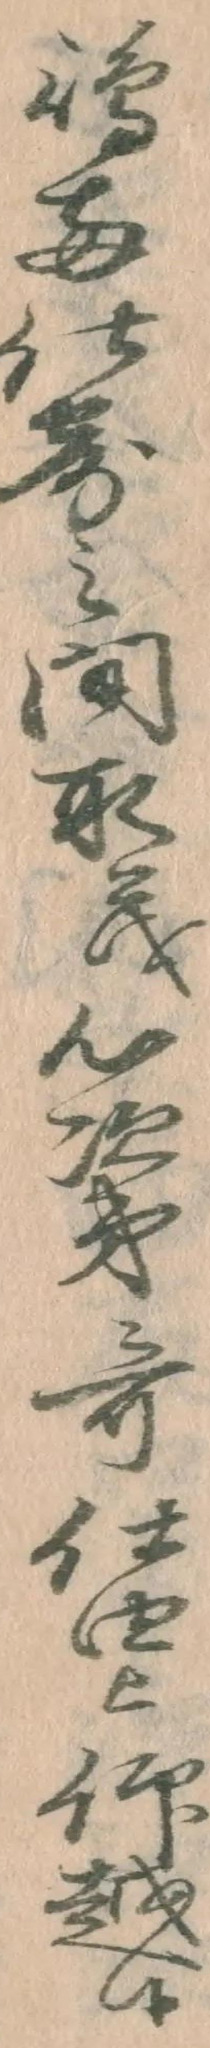島両仕寄之間取茂心次第に可仕由被仰越候
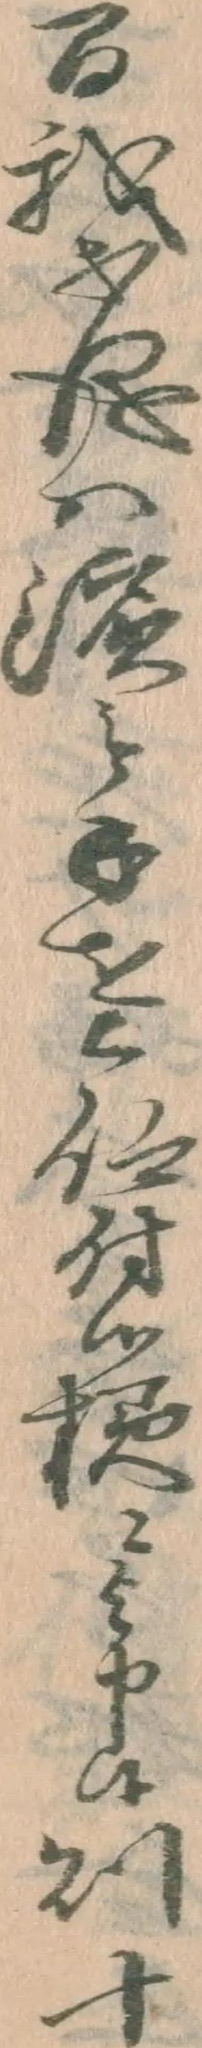間我等儀は浜之手を被仰付候様に与申候則十
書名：切支丹御退治記 49巻. [4]
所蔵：国立国会図書館 National Diet Library, JAPAN
